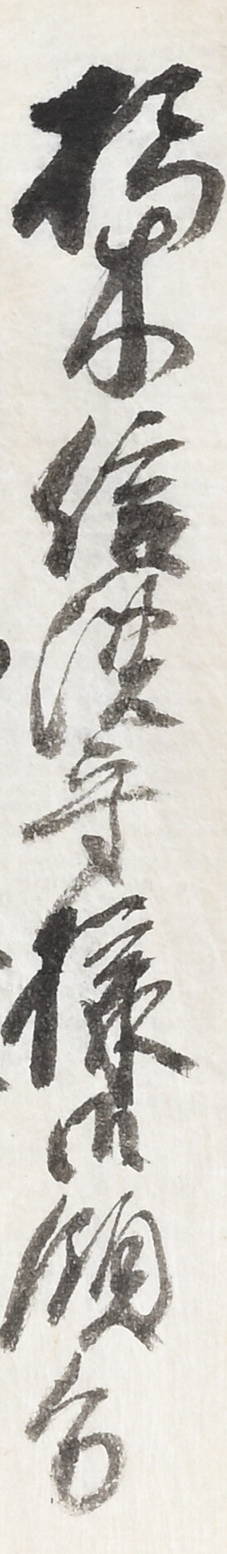朽木信濃守様御領分
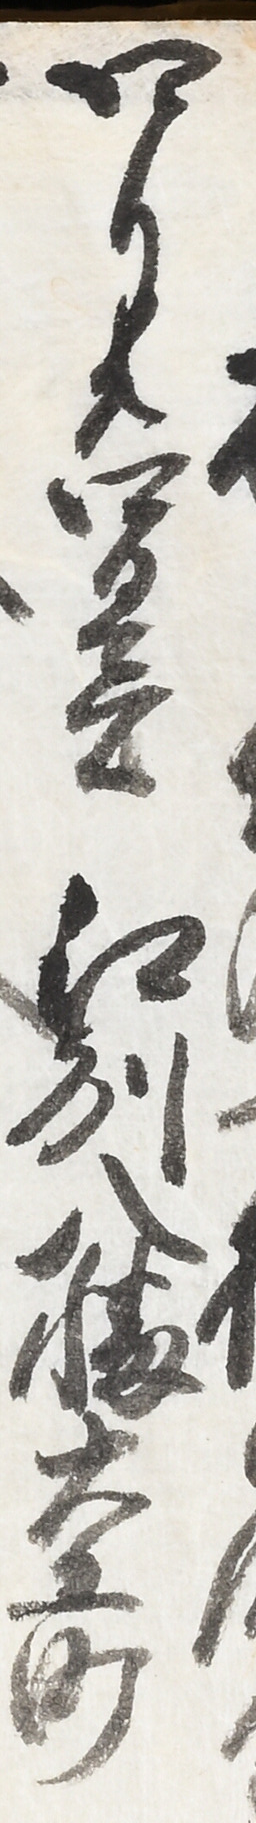四月廿四日着江州八幡大工町
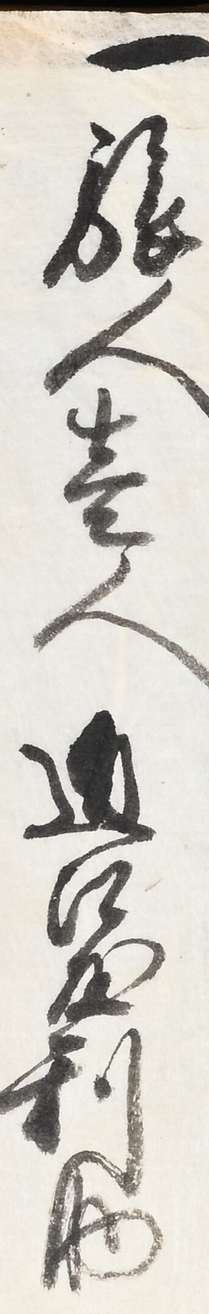一旅人壱人近江屋利助
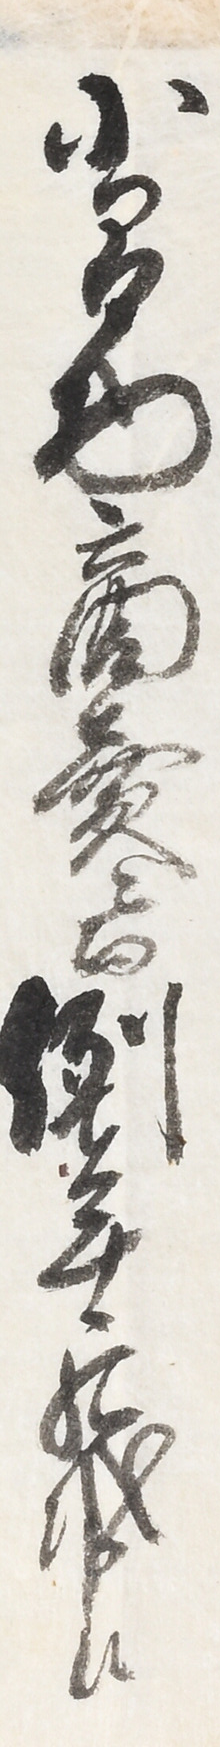小間物商売ニ而例年罷越申候
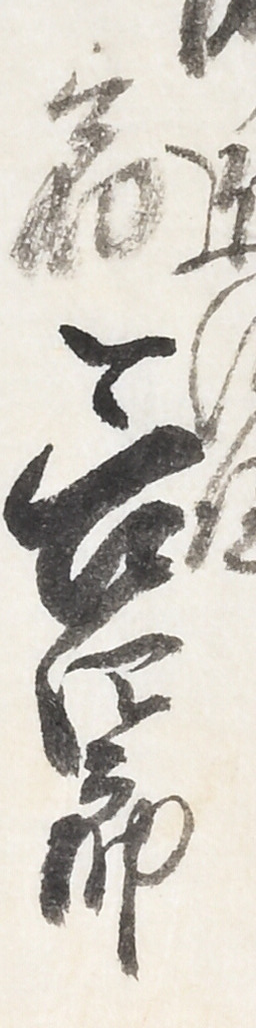宿善四郎
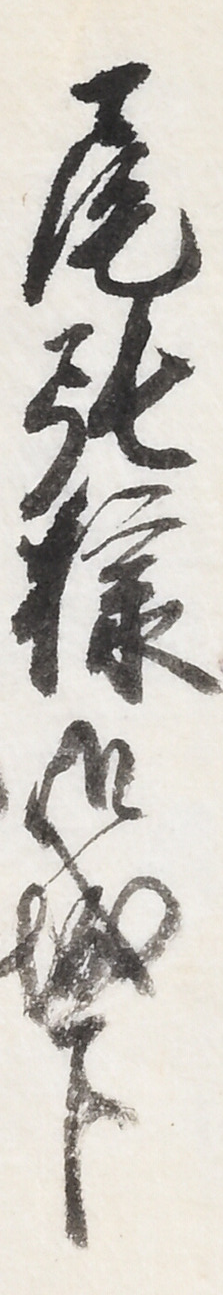尾張様御城下
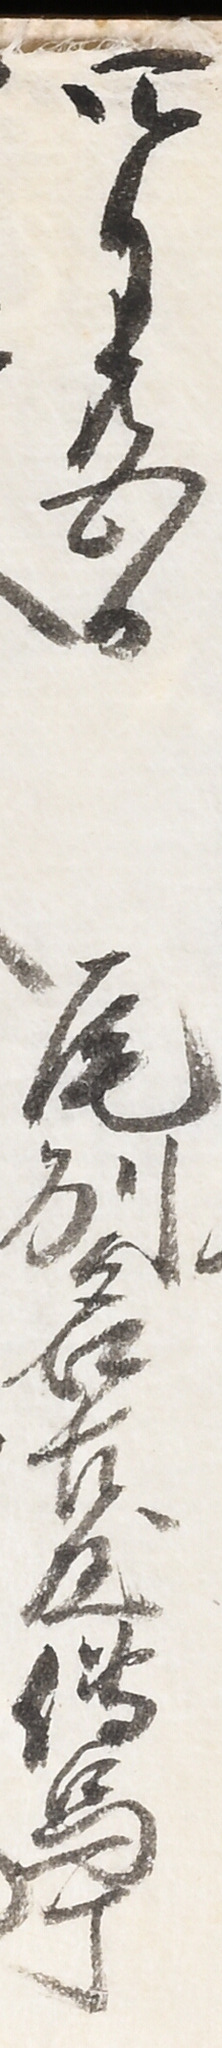四月廿五日尾州名古屋伝馬丁
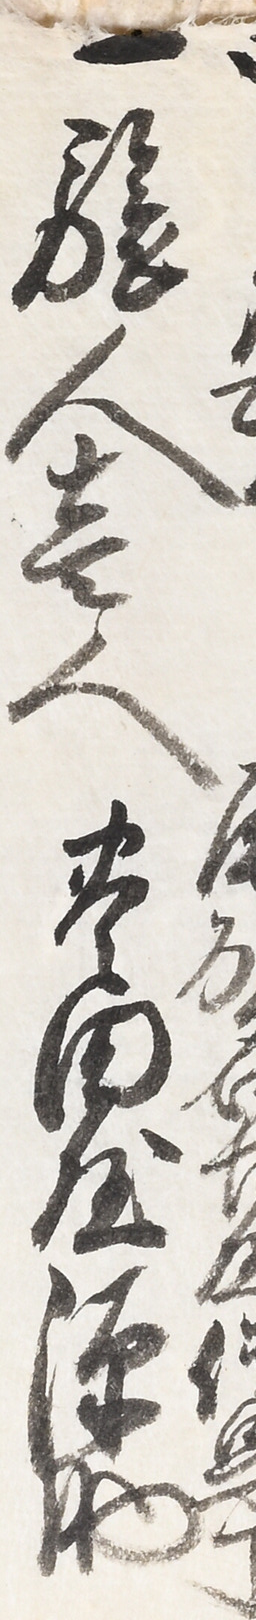一旅人壱人豊田屋源助
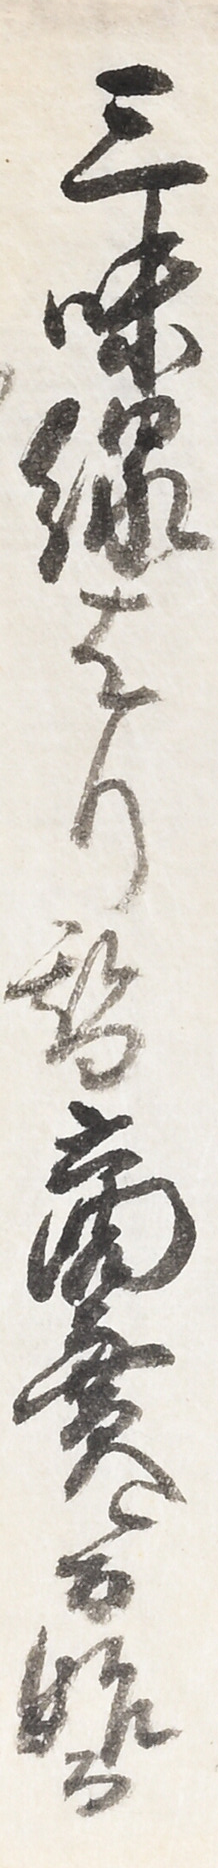三味線はり替商売ニ而始而
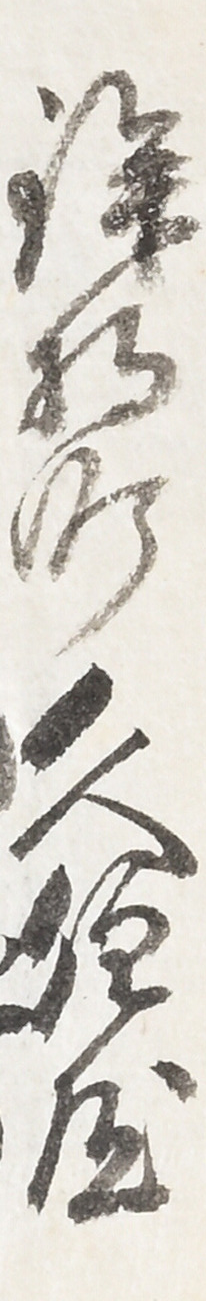鉾持町久住屋
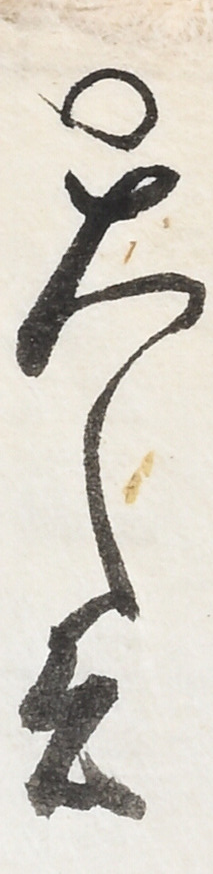〇右之者
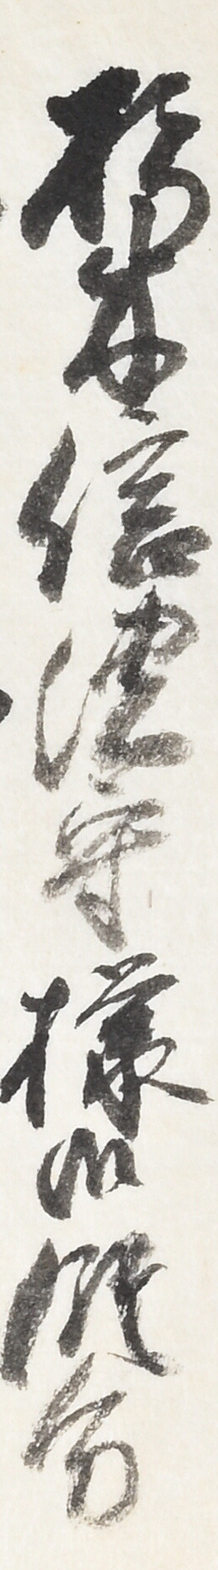朽木信濃守様御領分
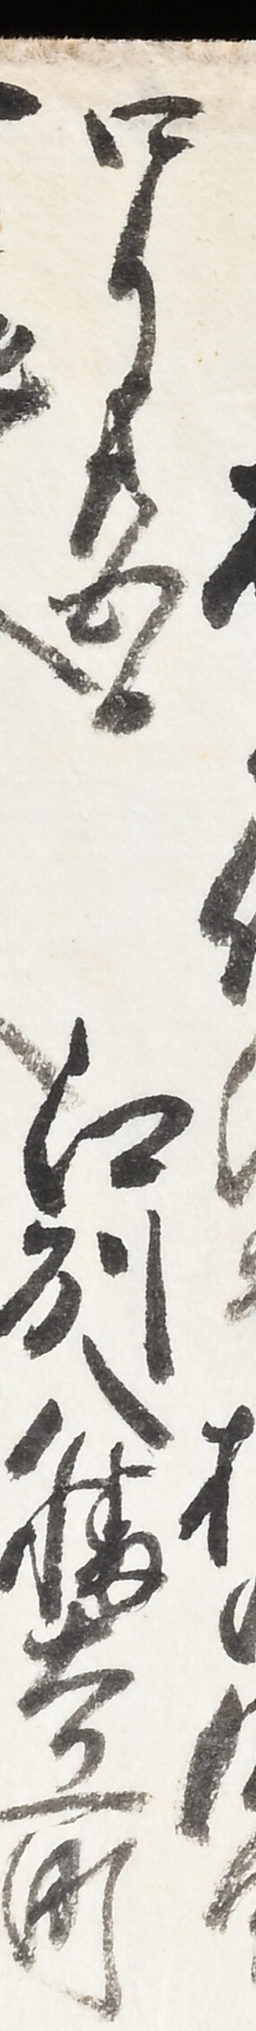四月廿五日江州八幡大工町
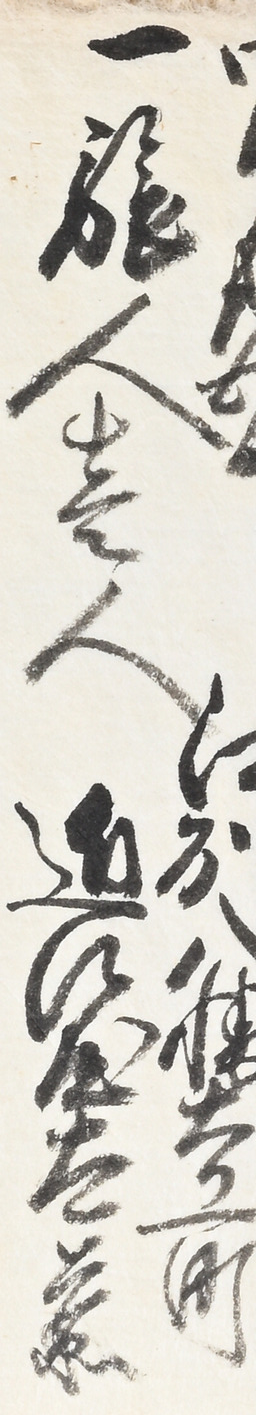一旅人壱人近江屋太兵衛
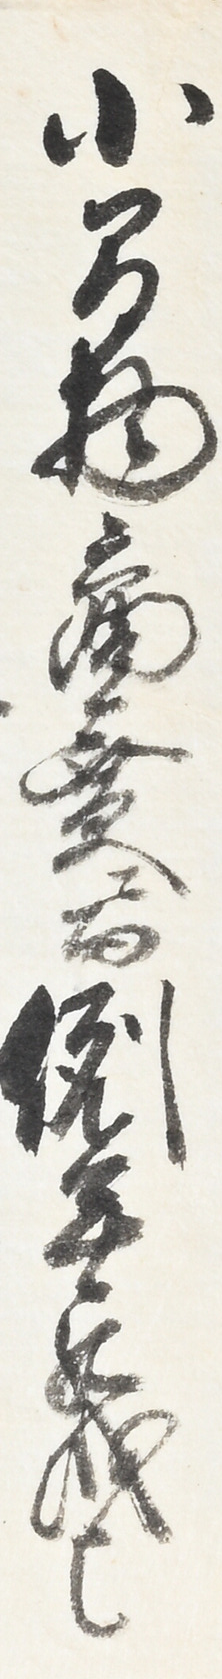小間物商売ニ而例年罷越申候
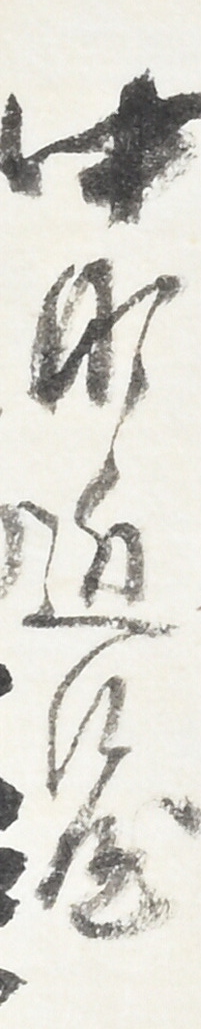中町近江屋
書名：旅人泊控帳
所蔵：伊那市立高遠町図書館・合同会社AMANE
